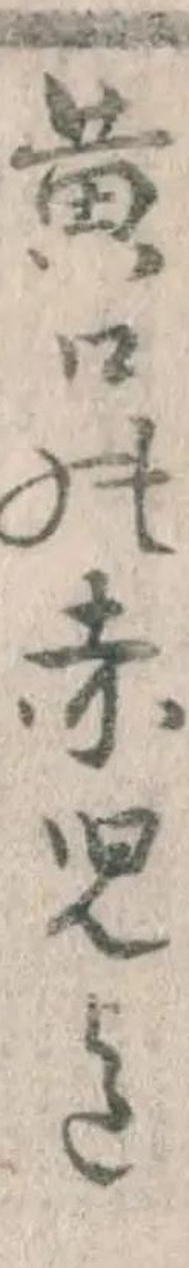黄口の赤児迄
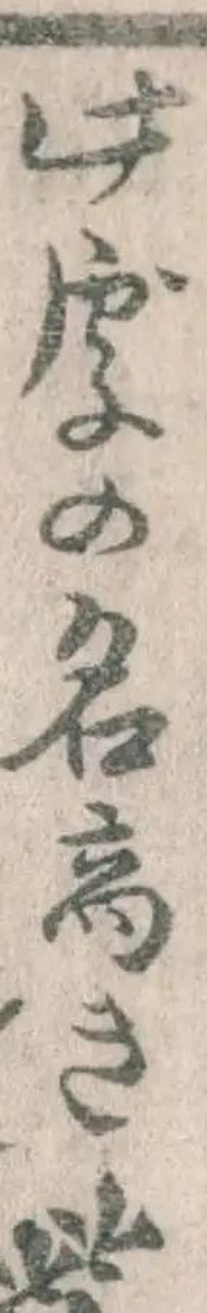此処の名高きを
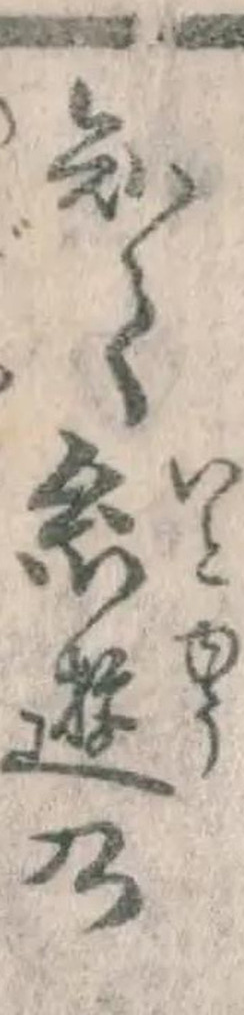知て糸遊の
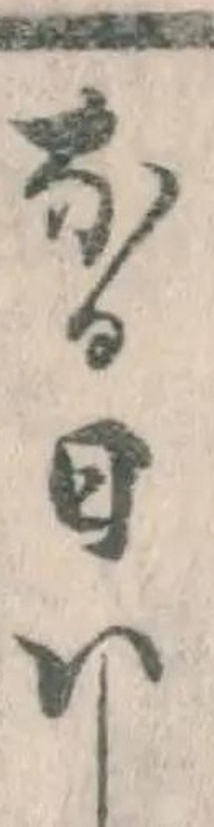なる日は
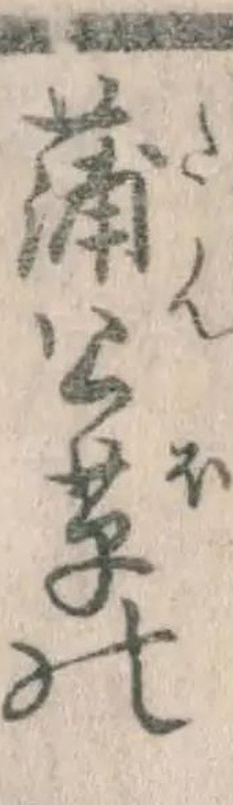蒲公草の
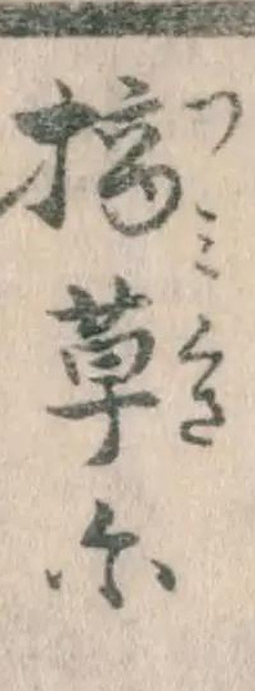摘草に
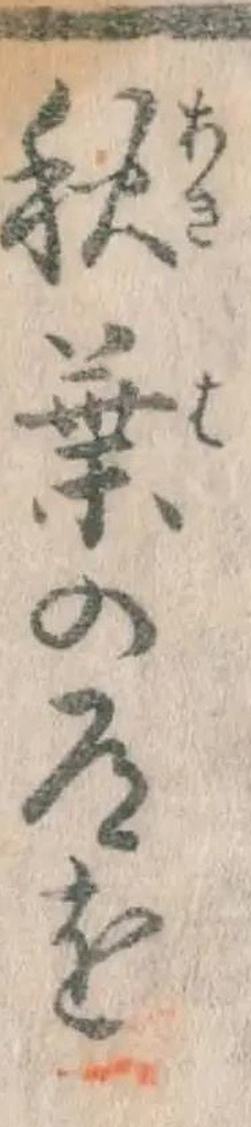秋葉の道を
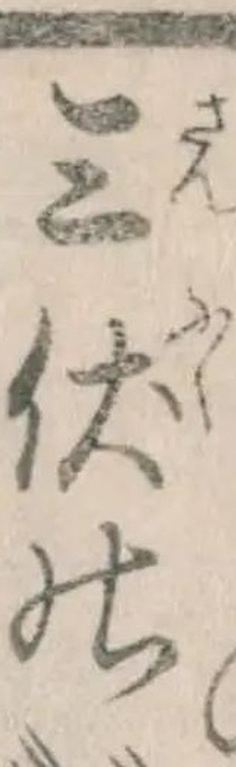三伏の
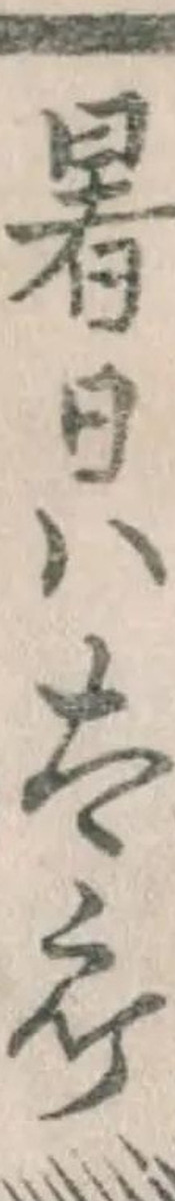暑日は太郎
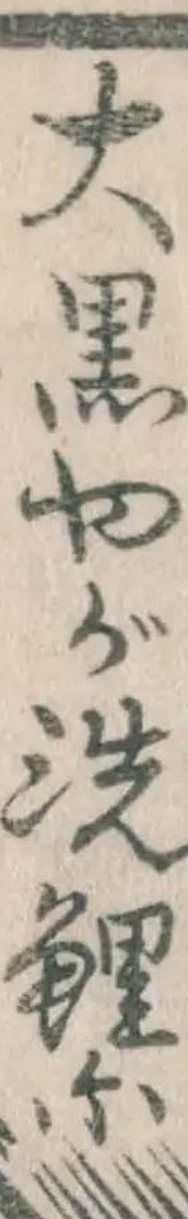大黒やが洗鯉に
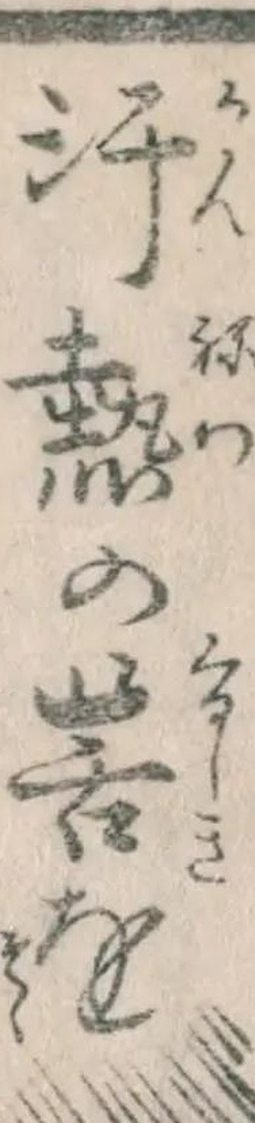汗熱の苦を濯き
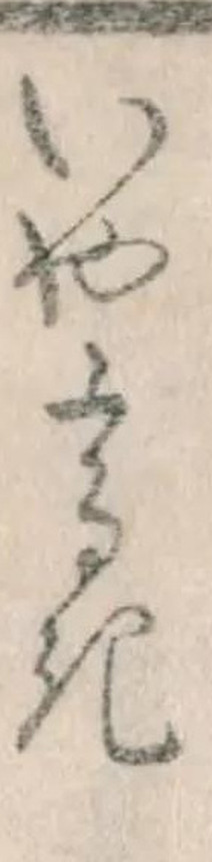いや高き
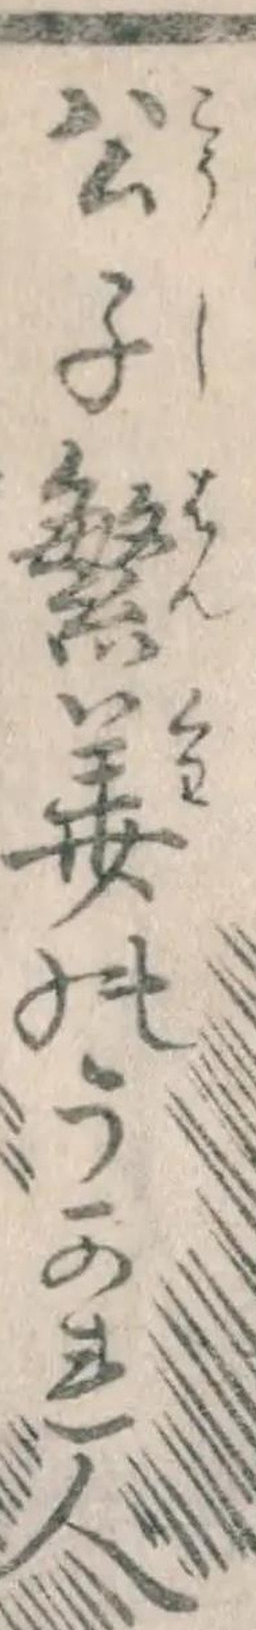公子繁華のうかれ人
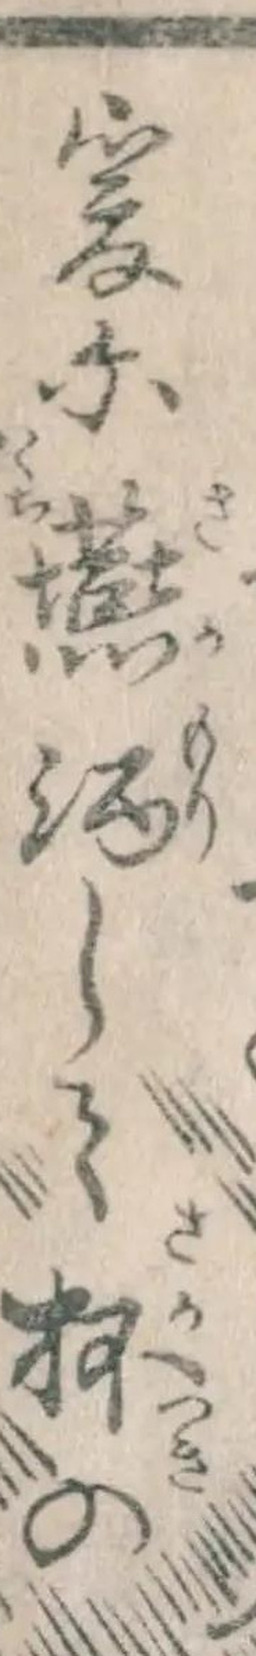爰に燕酒して杯の
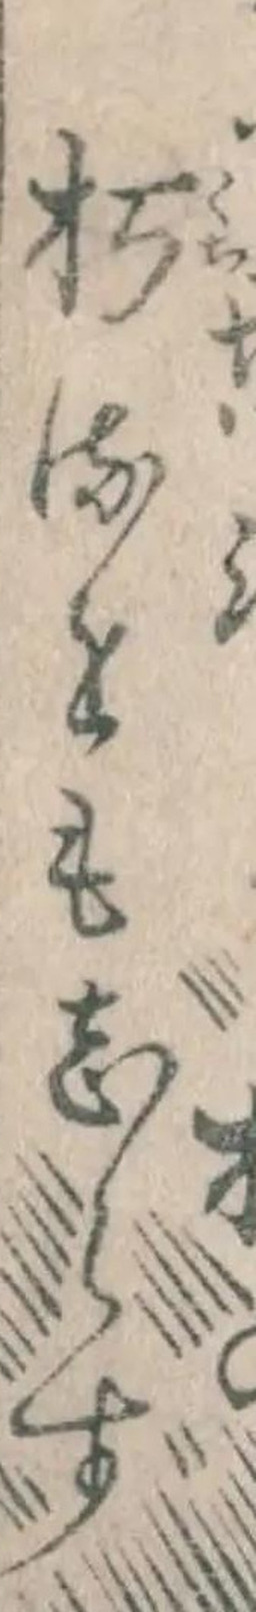朽るをもしらす

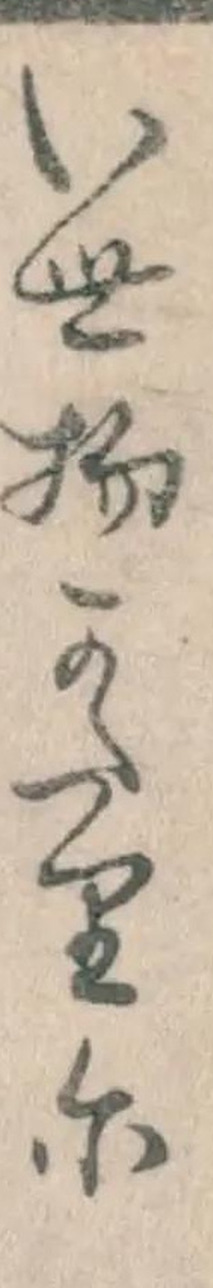いせ物かたりに
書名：絵本物見岡
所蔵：国立国会図書館 National Diet Library, JAPAN
